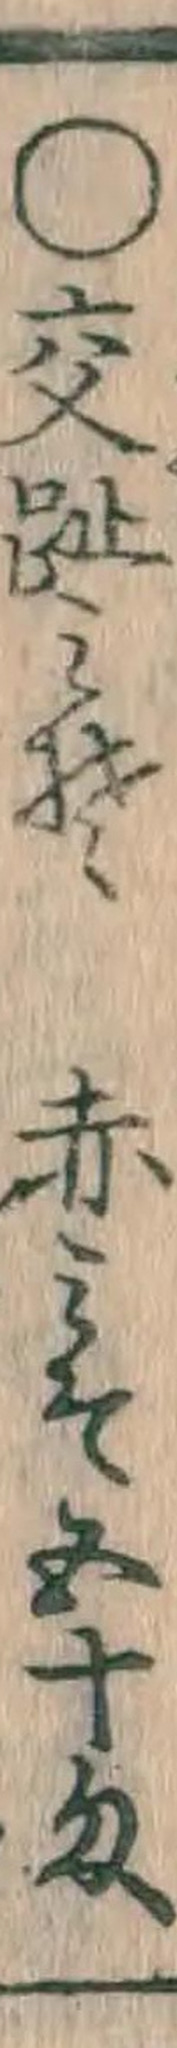○交趾みそ赤みそ五十匁
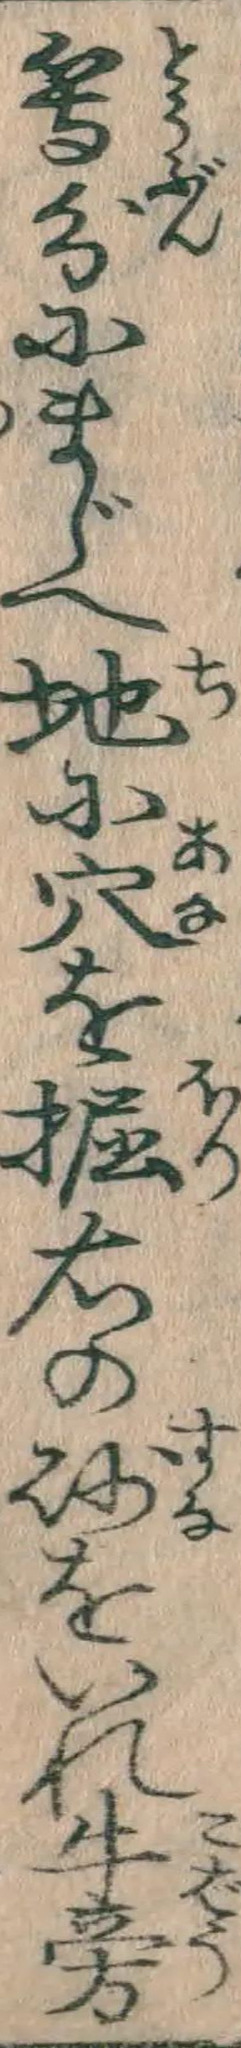等分にまじへ地に穴を掘右の砂をいれ牛旁
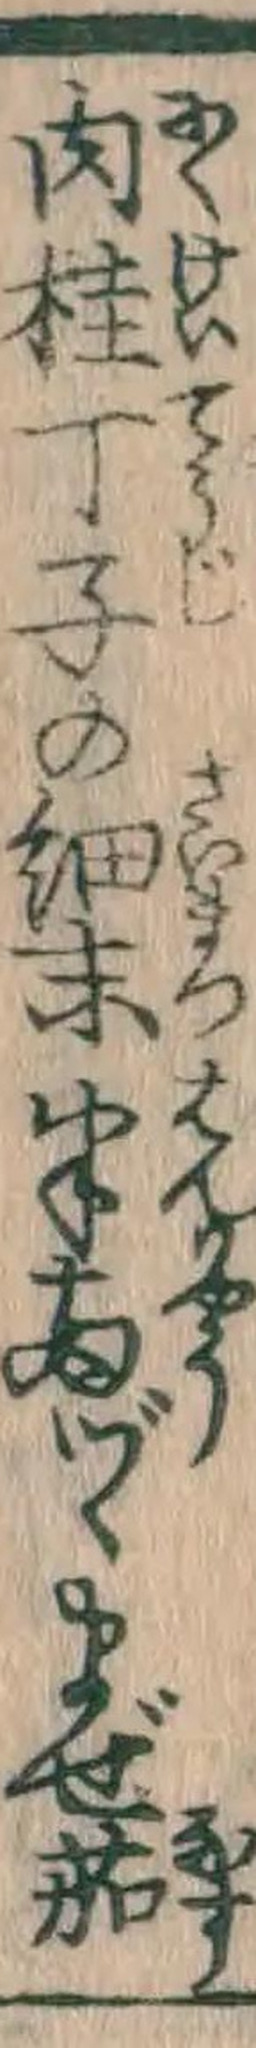肉桂丁子の細末半両づゝまぜ茄
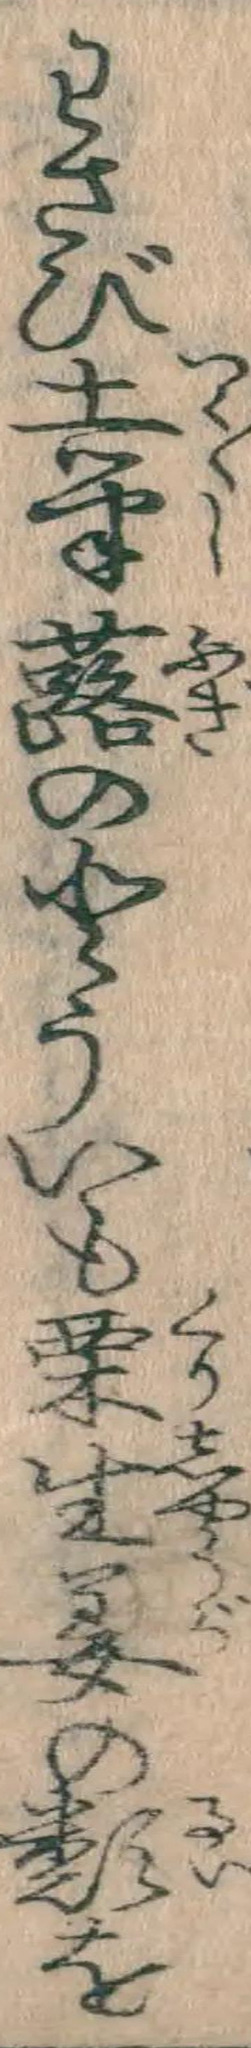わさび土筆蕗のとういも栗生姜の類を
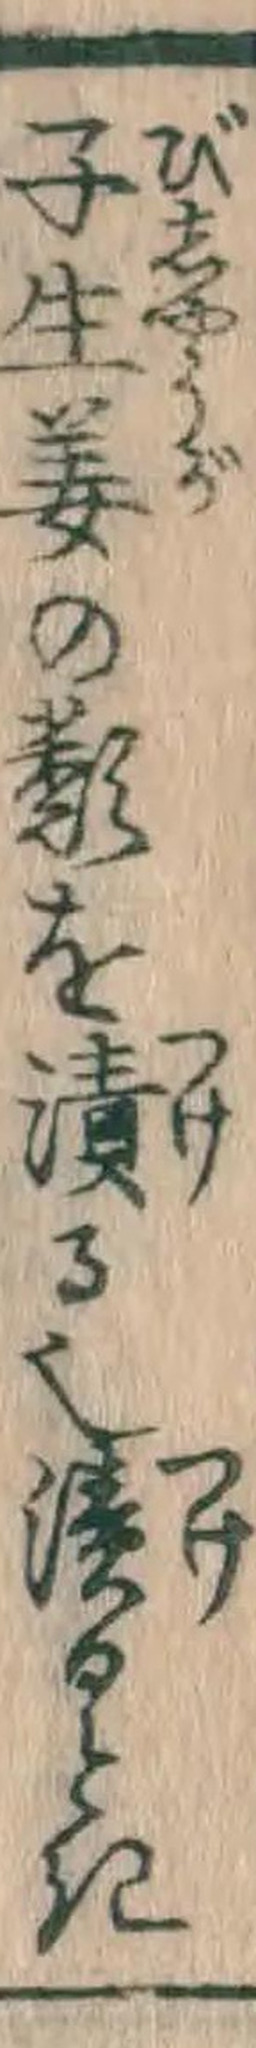子生姜の類を漬る也漬るとき
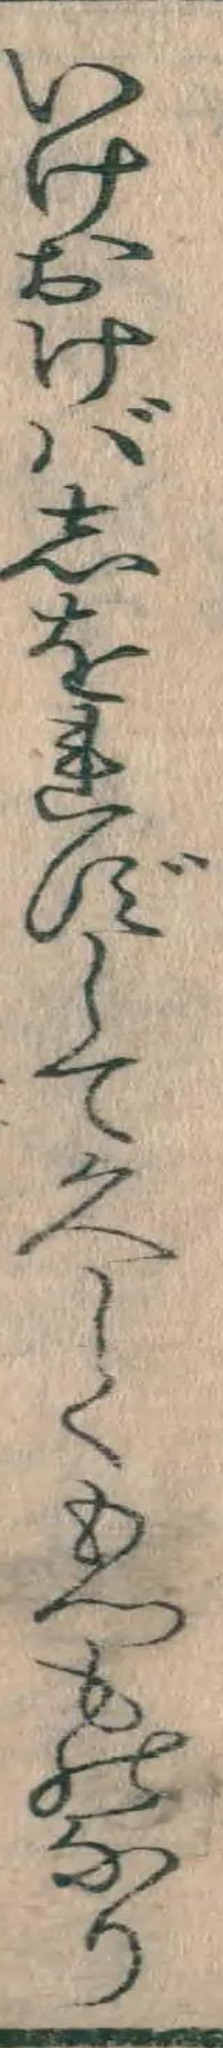いけおけばしをれずして久しくもつものなり
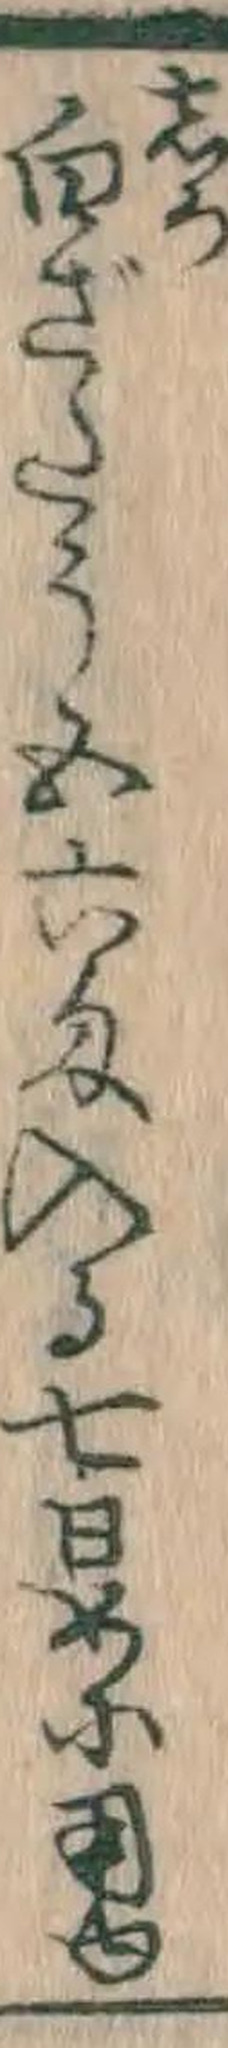白ざたう五六匁入る七日めに用ゆ
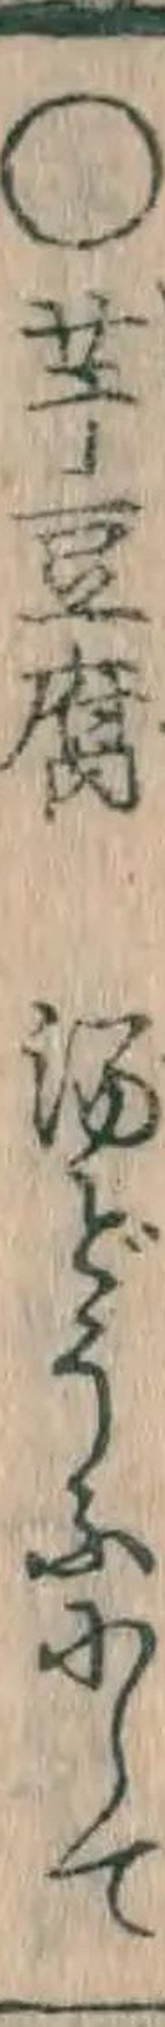○芋豆腐湯どうふにして
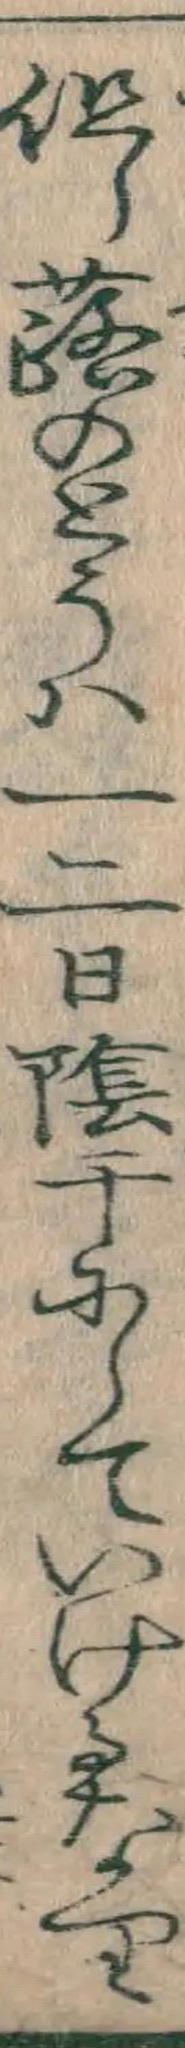但し蕗のとうは一二日陰干にしていけるなり
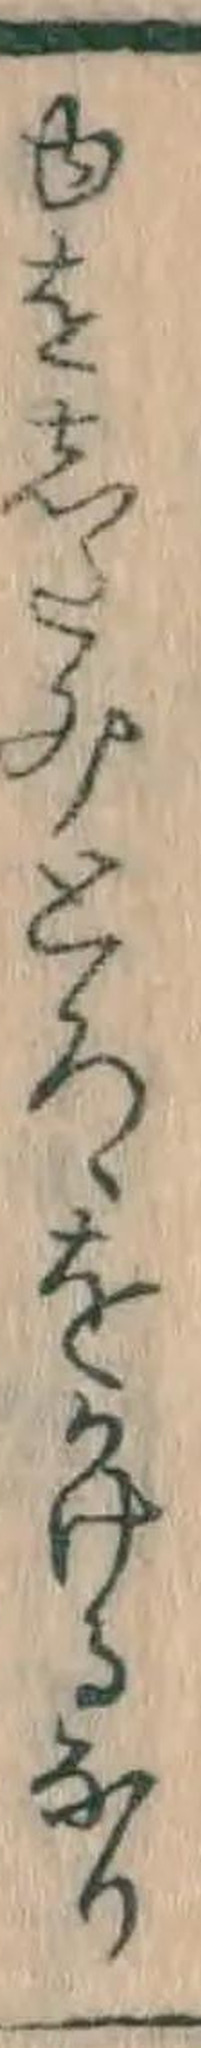ゆをしたみとろゝをかけるなり
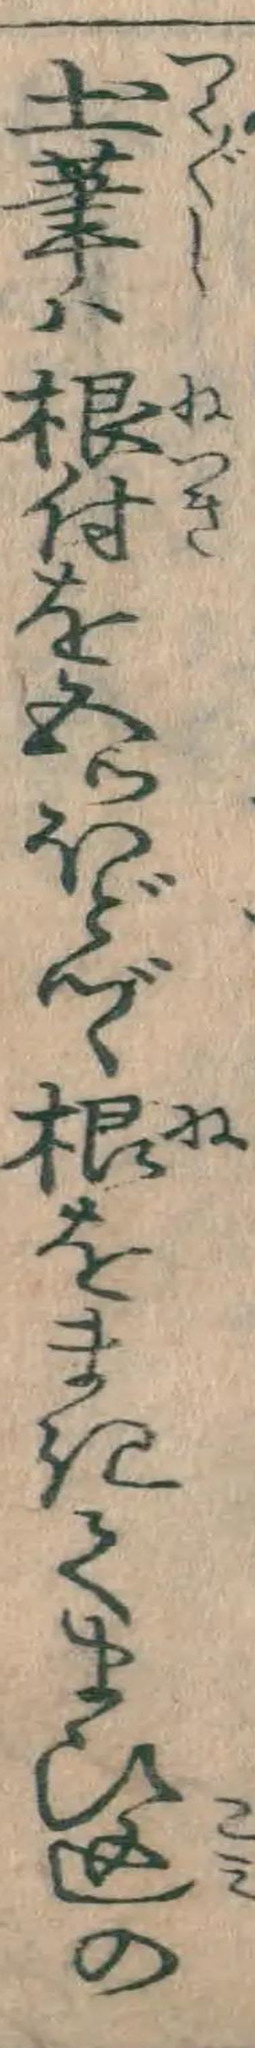土筆は根付を五ッほどづゝ根をまきてまひ込の

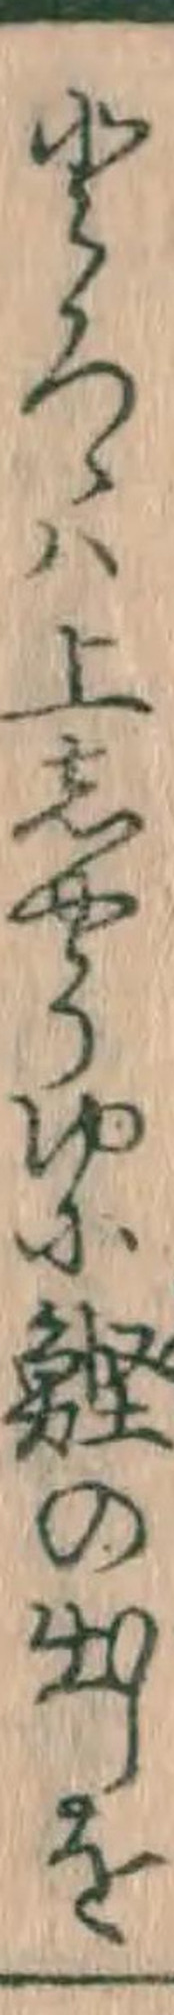とろゝは上しやうゆに鰹の出しを
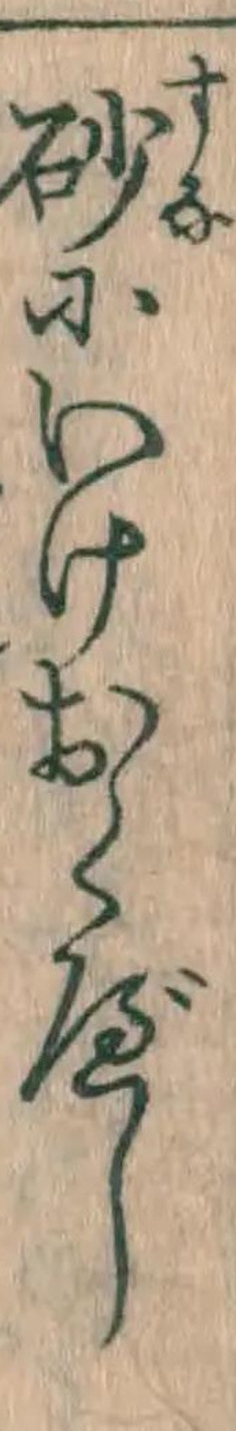砂にいけおくべし
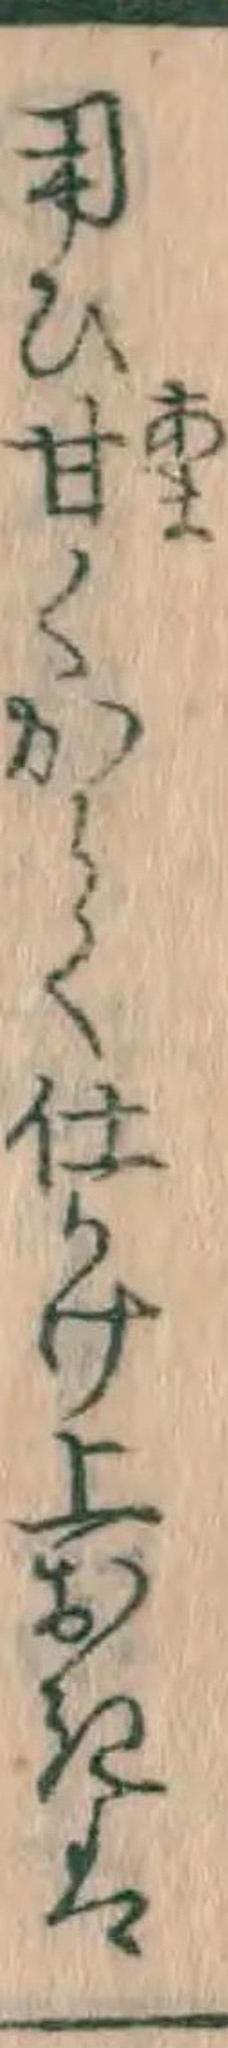用ひ甘くからく仕かけ上おきは
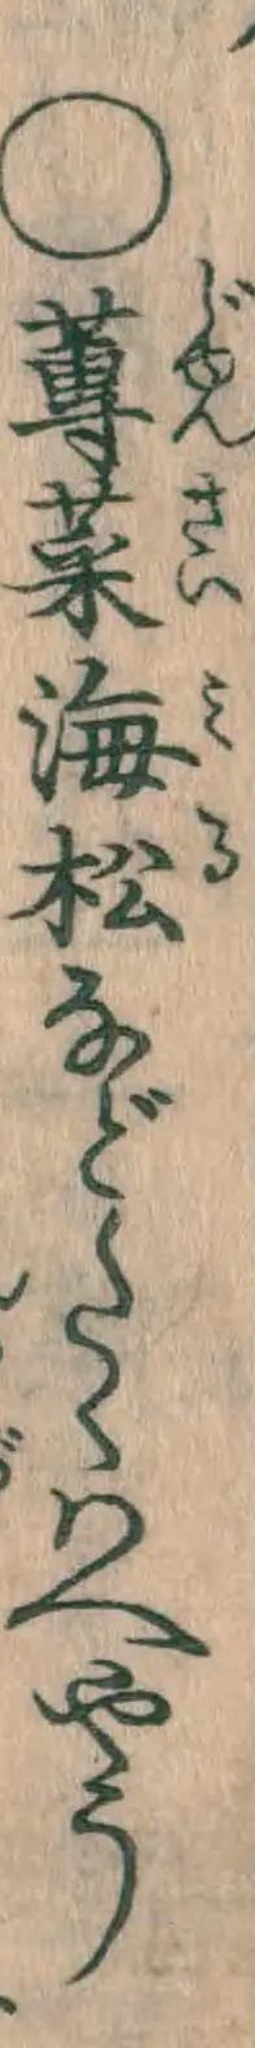○蓴菜海松などたくはへやう
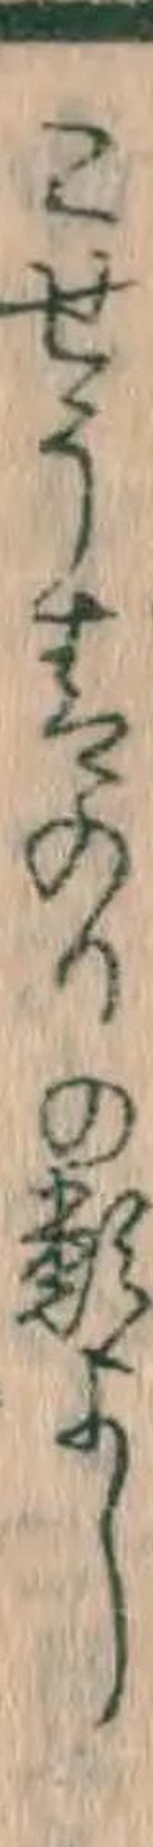こせう青のりの類よし
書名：広益秘事大全 3巻. [5]
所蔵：国立国会図書館 National Diet Library, JAPAN
